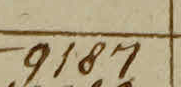9187
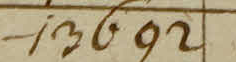13692
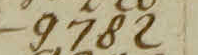9782
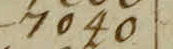7040
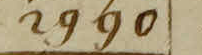2990
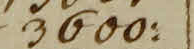3600:
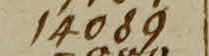14089
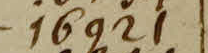16921
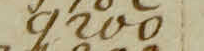9200
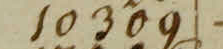10309
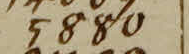5880
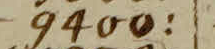9400:
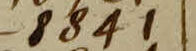8841
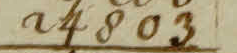24803
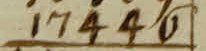17446
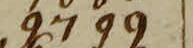9799
